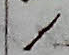1
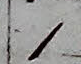1
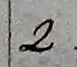2
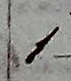1
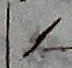1
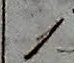1
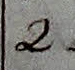2
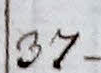37
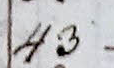43
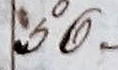56
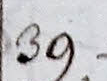39
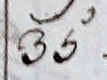35
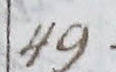49
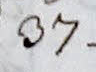37
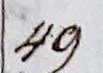49
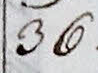36
